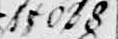15038
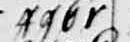4961
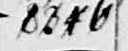8346
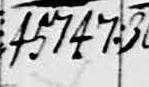45747
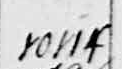10114
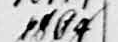1804
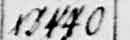13440
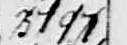3797
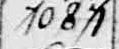7087
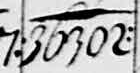36302
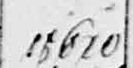15620
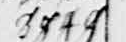3549
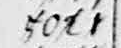5021
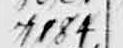7184
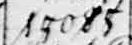15085
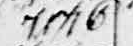7176
